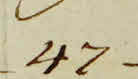47
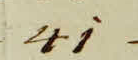41
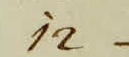12
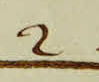2
